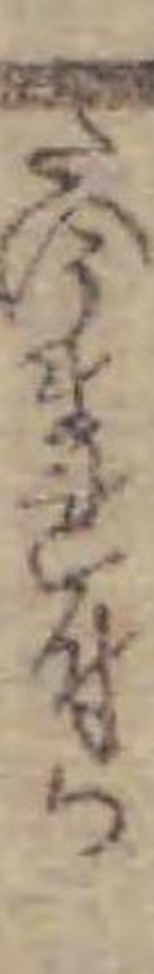たいうまれ付か
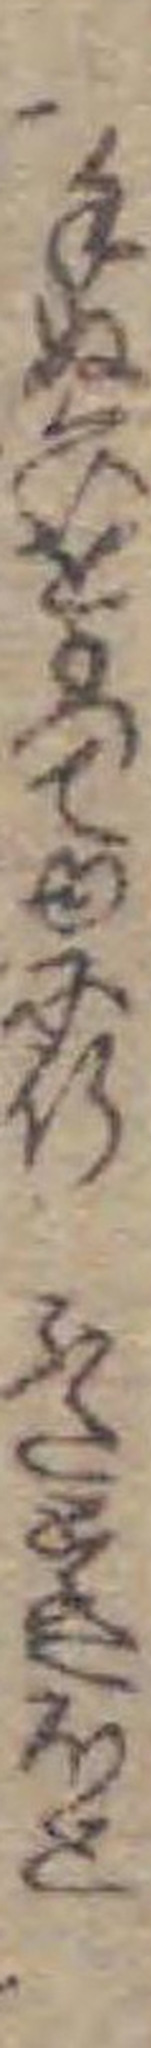手ぬくいをもつてゆに行ふたときほと
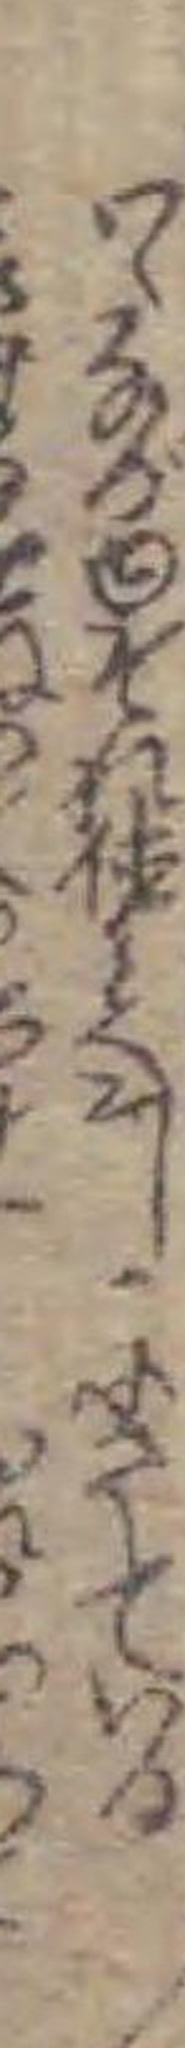いゝながゆそれ德兵へこしにさしている
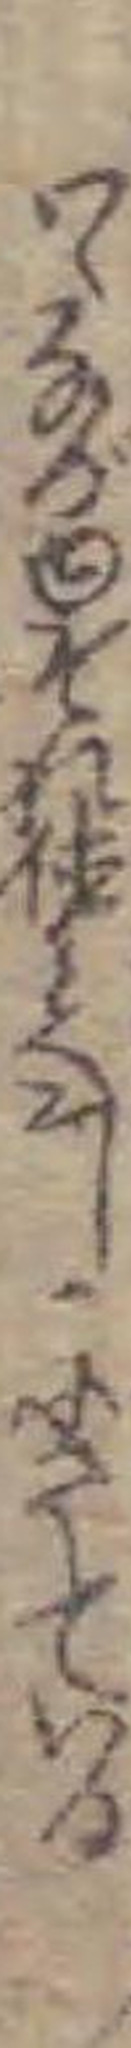いゝながゆそれ德兵へこしにさしている
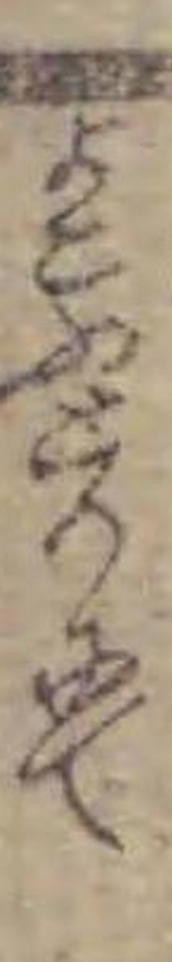よこふとりにて
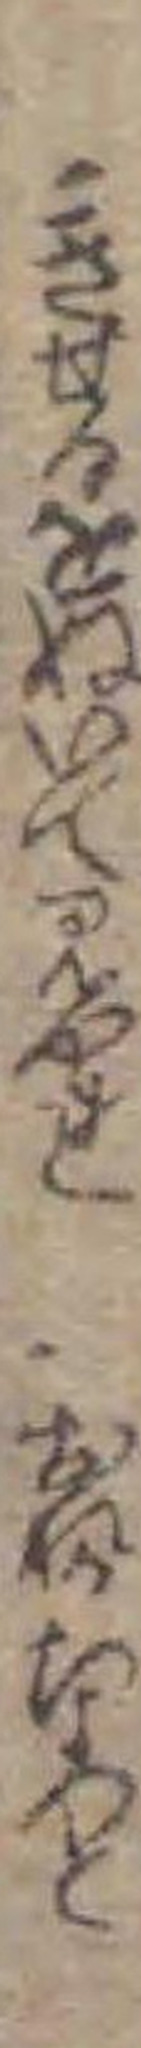きせるをぬいて見やれおれかちよつと
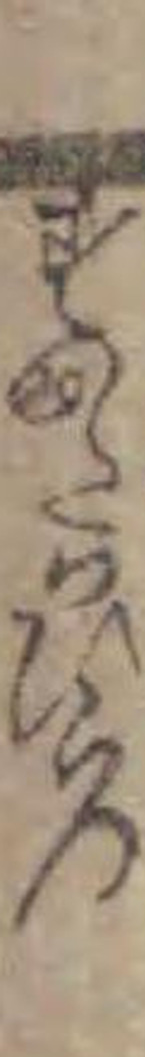すかたかひらつ
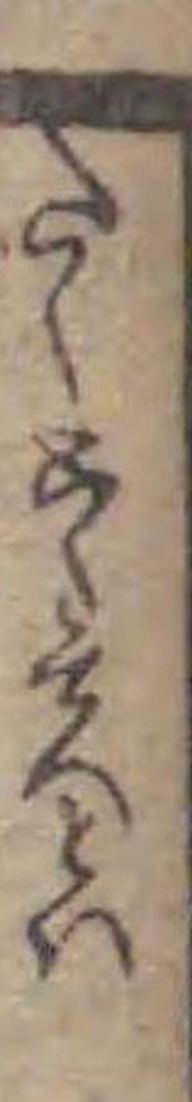たくとく兵へとは
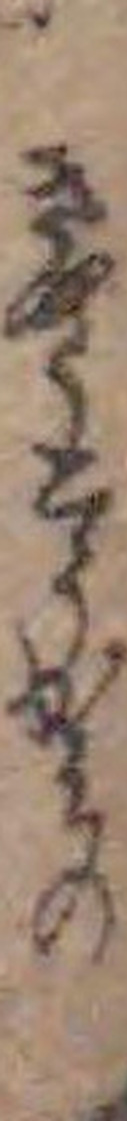きやうこうかみの
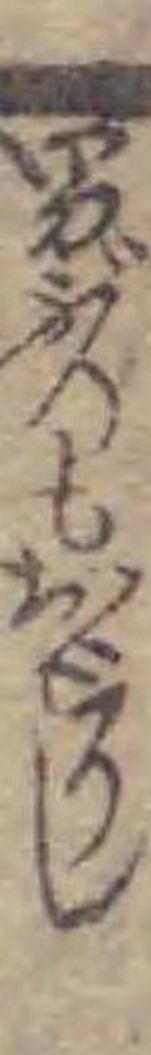男ぶりもおとりし
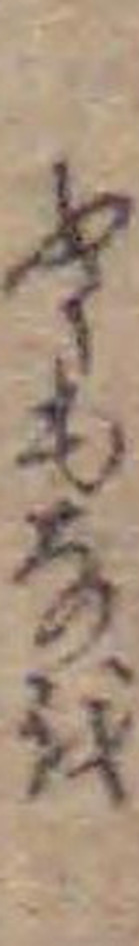ふうもなを
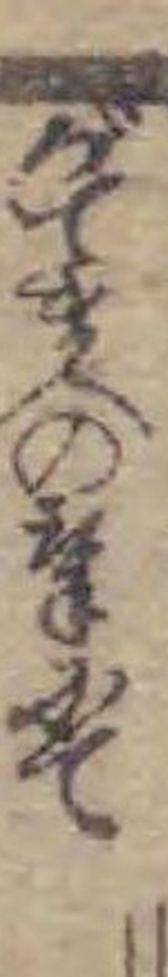がてまへの気にて
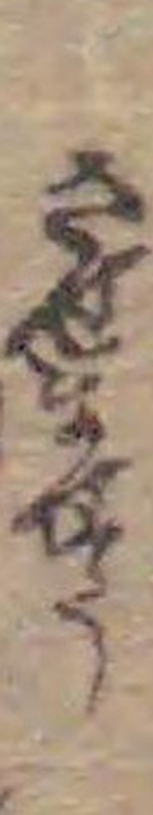させませう
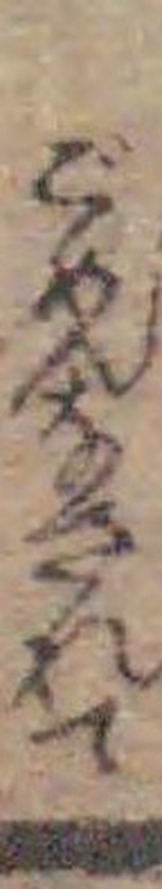ごめんなされて
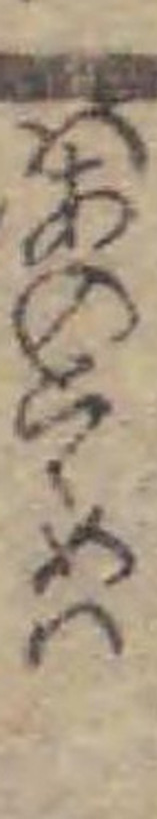はあのとくめは
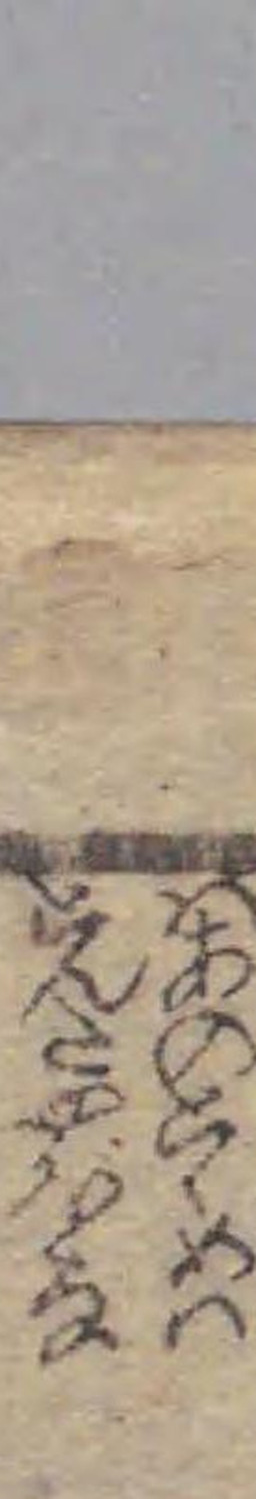とんたやぼな
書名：通風伊勢物語 : 3巻
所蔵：国立国会図書館 National Diet Library, JAPAN
